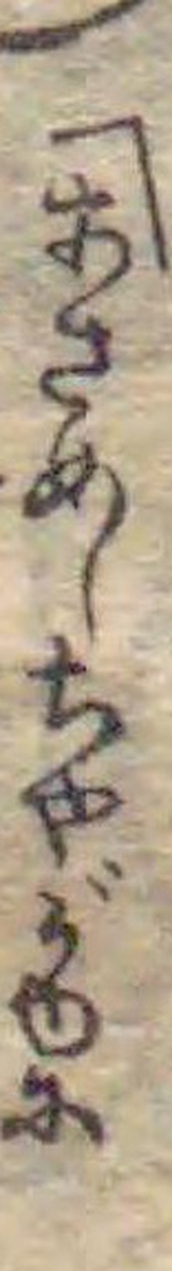あさめしちやがゆに
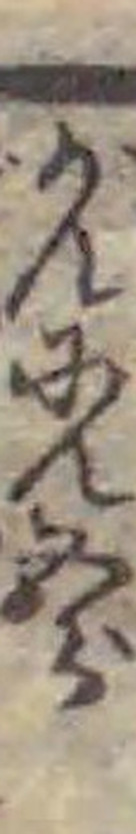かんにん五郎
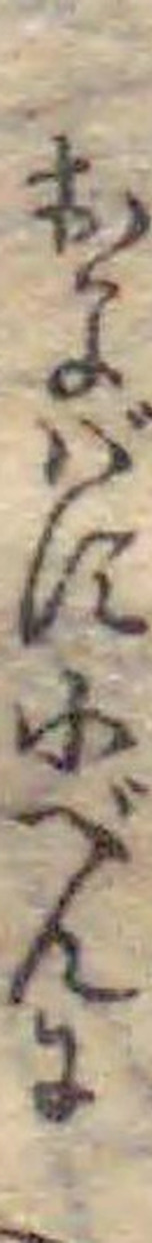およばす小べんに
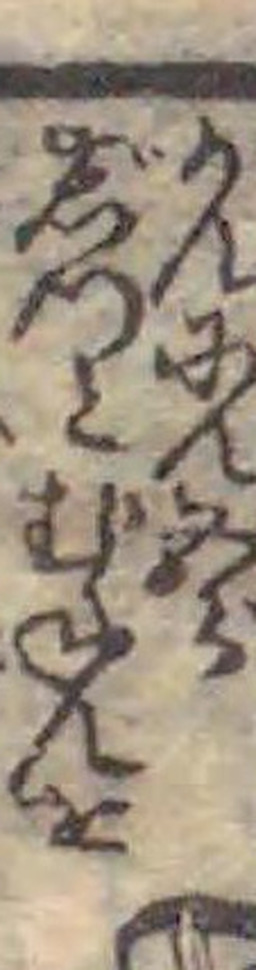じつとむねんを
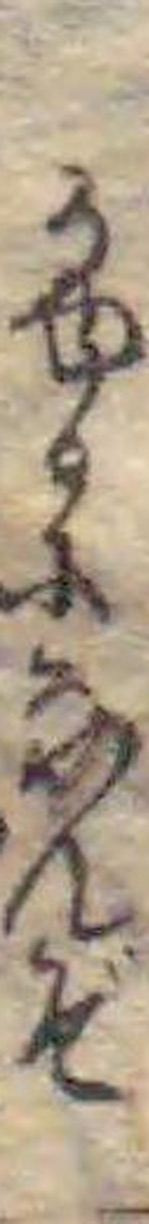かゆるになんぞ
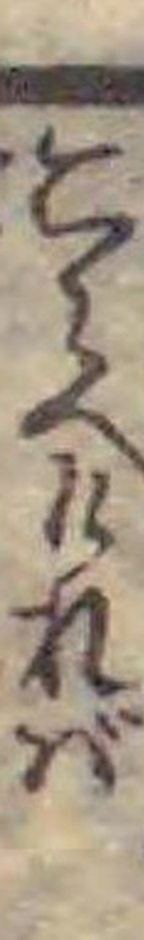こらへければ
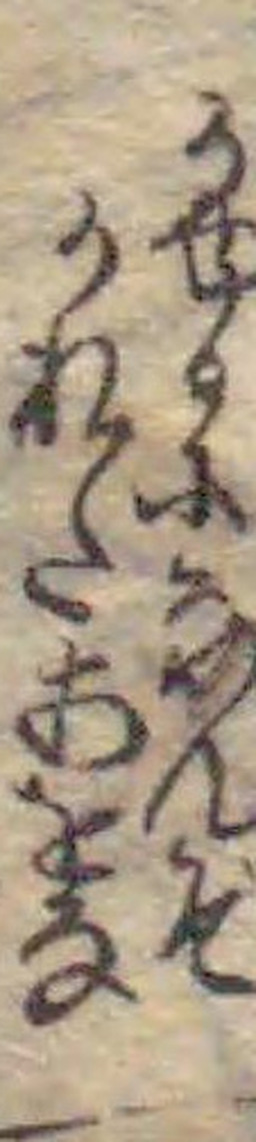かれたあおな
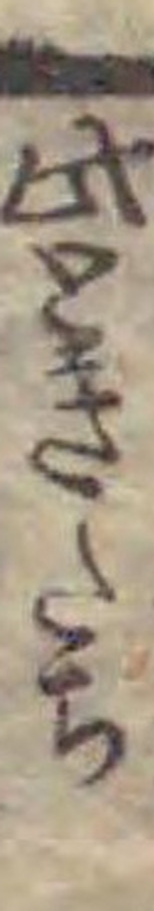此ときはち
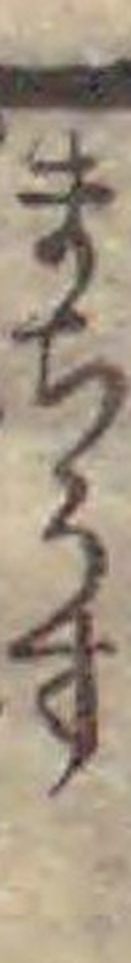まちうす
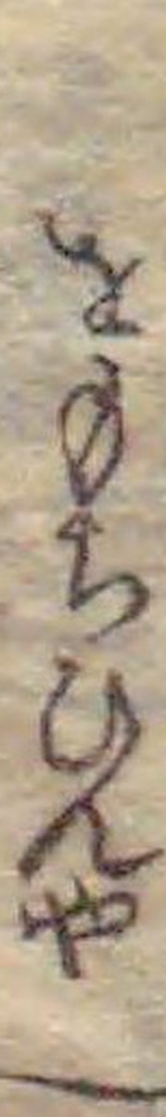をもちひんや
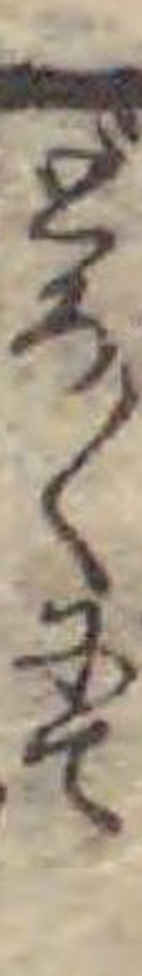どろ〳〵にて
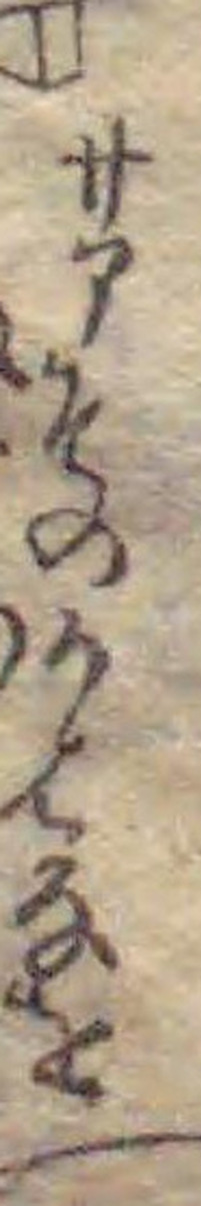サアそのかたなを
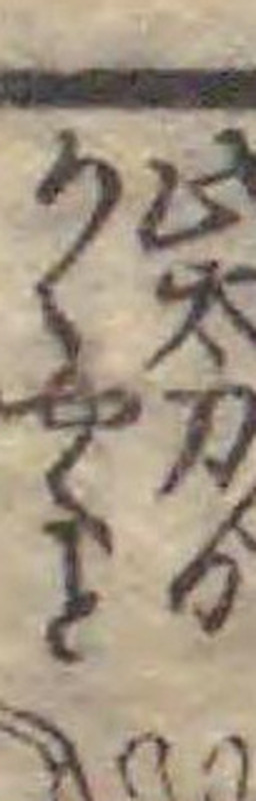かくやくと
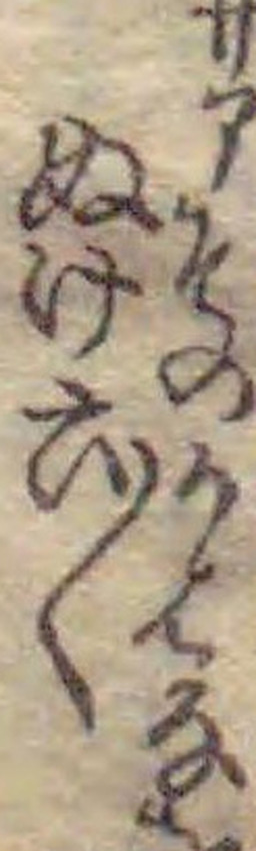ぬけ六〳〵
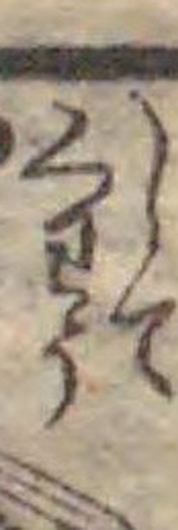くわう
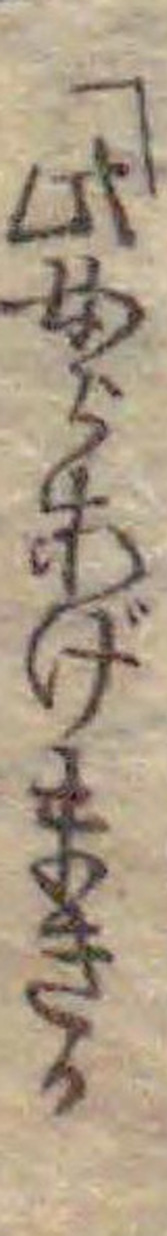〽此女郎あげまきか
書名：身体開帳略縁起 : 3巻
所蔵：国立国会図書館 National Diet Library, JAPAN
